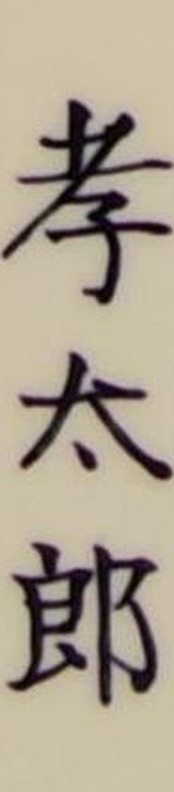孝太郎
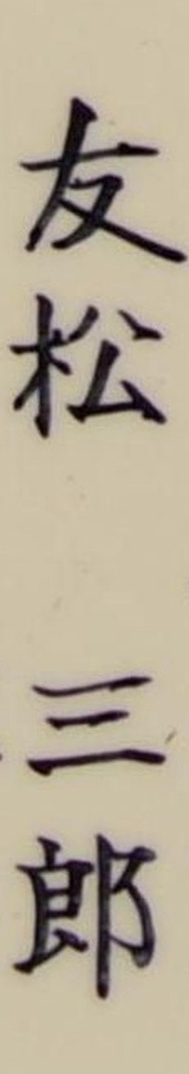友松三郎
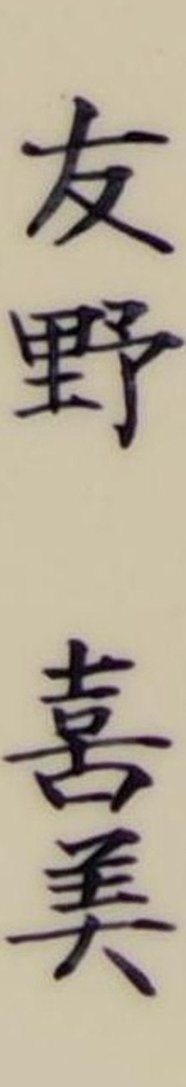友野喜美
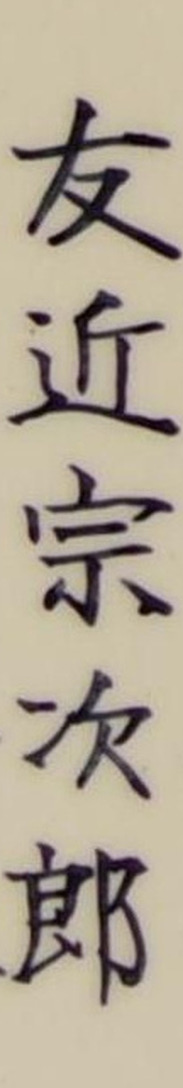友近宗次郎
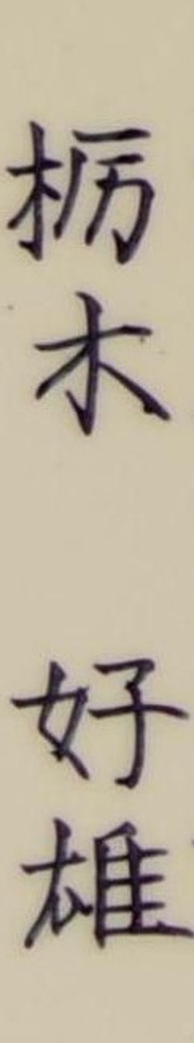栃木好雄
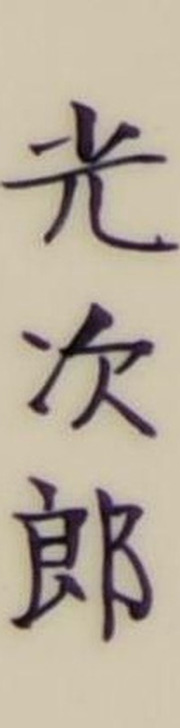光次郎

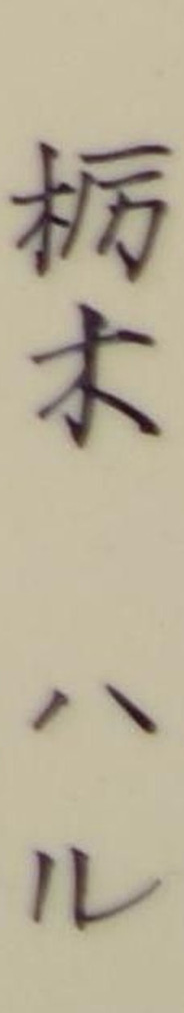栃木ハル
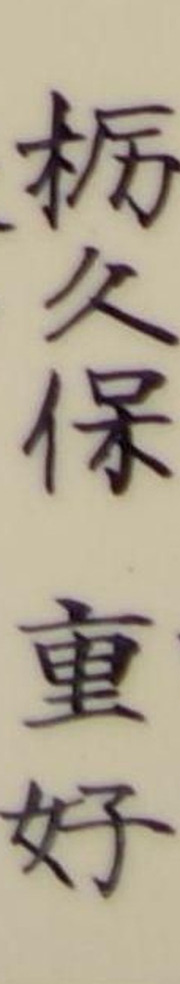栃久保重好
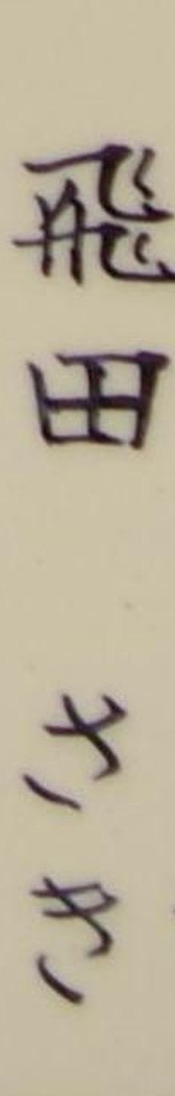飛田さき
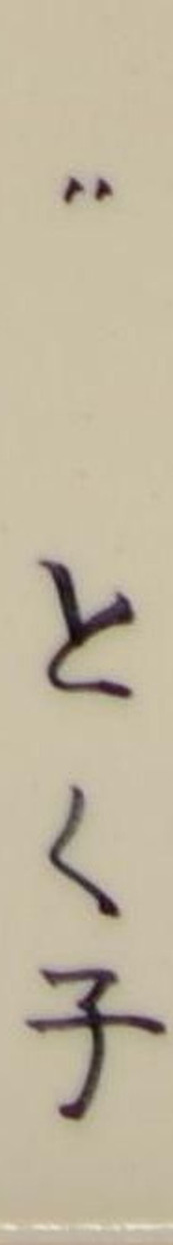とく子
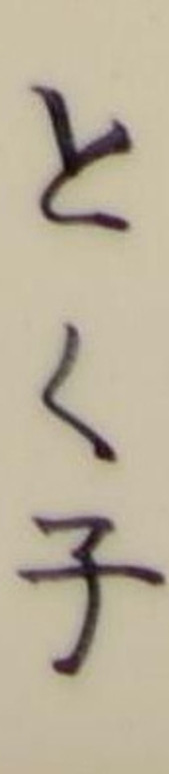とく子
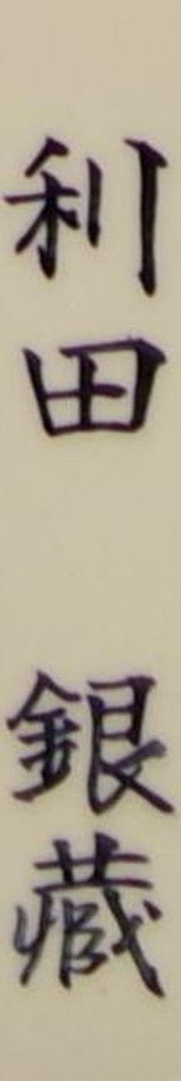利田銀蔵
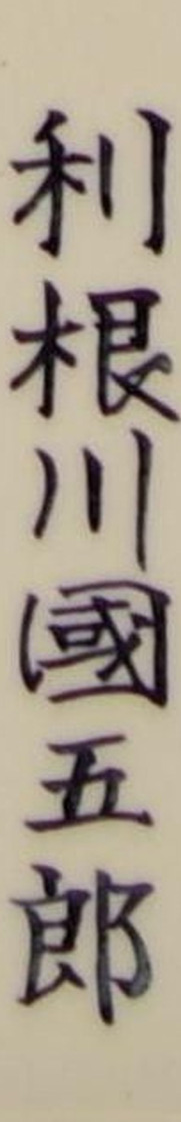利根川国五郎
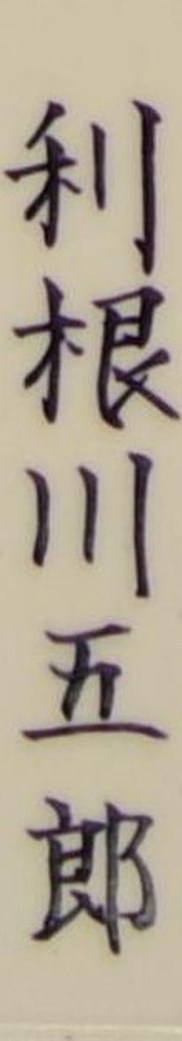利根川五郎
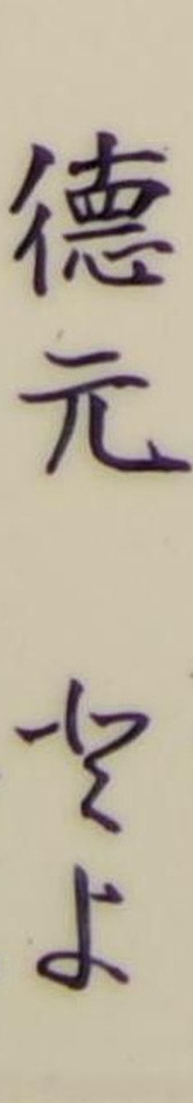徳元とよ
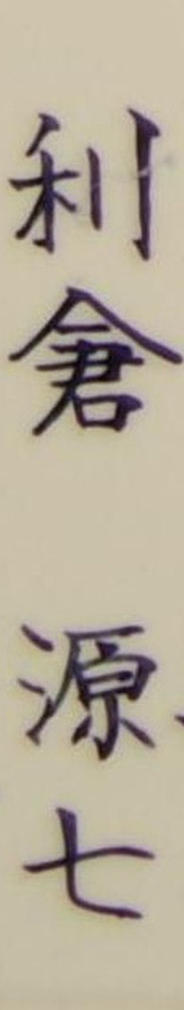利倉源七
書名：A~D
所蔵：koyasan kongobuji
